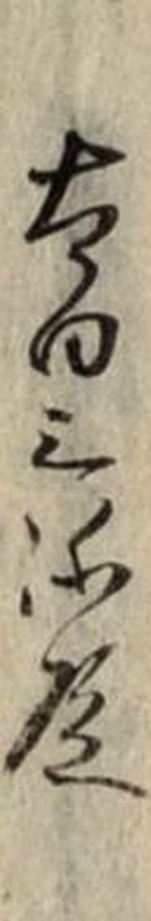太田三弥殿
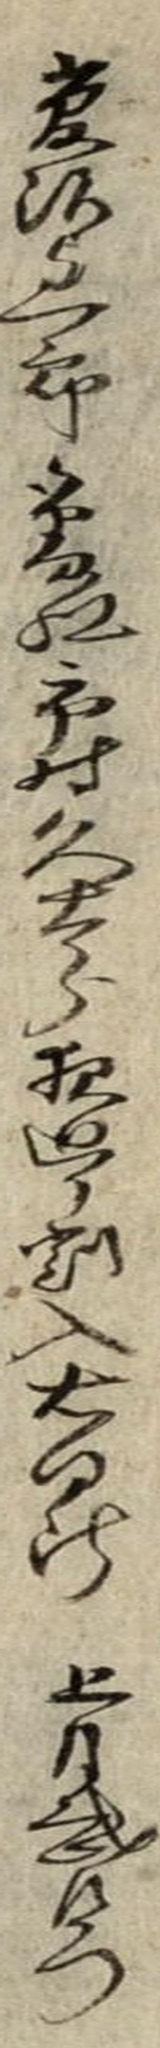菅沼与一郎御番組市村久太郎夜廻り割入右同断上月武左衛門
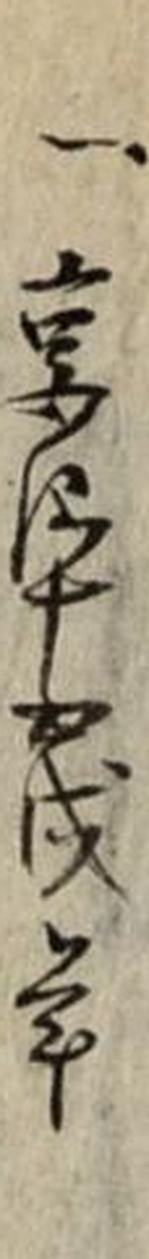一享保十五戌年
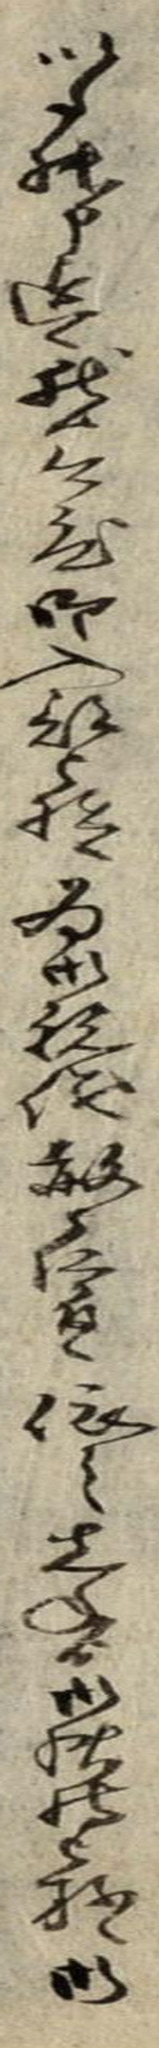以手紙申達候然は今度御入部被遊候為御祝儀赦被仰付候依之先年ゟ御扶持被放候御
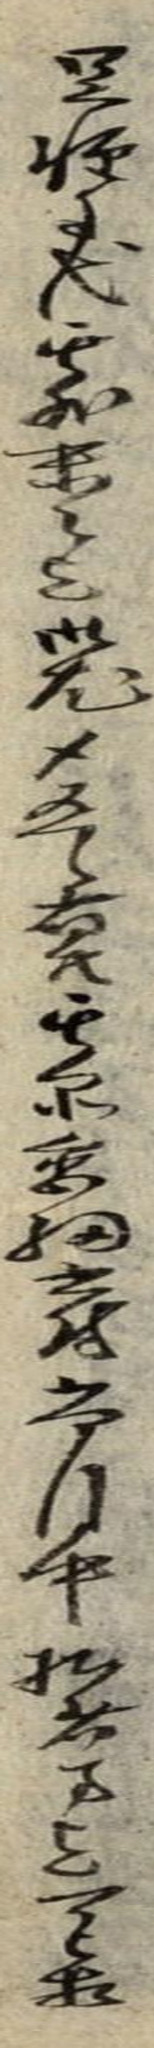足軽手代其外末々迄御尤メ有之者共其品委細書付当月中拙者方迄可被相
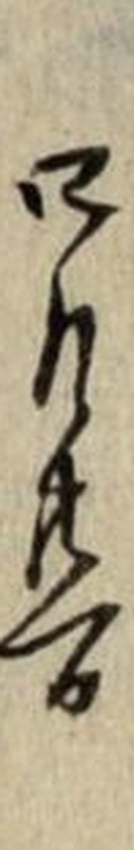四月廿五日
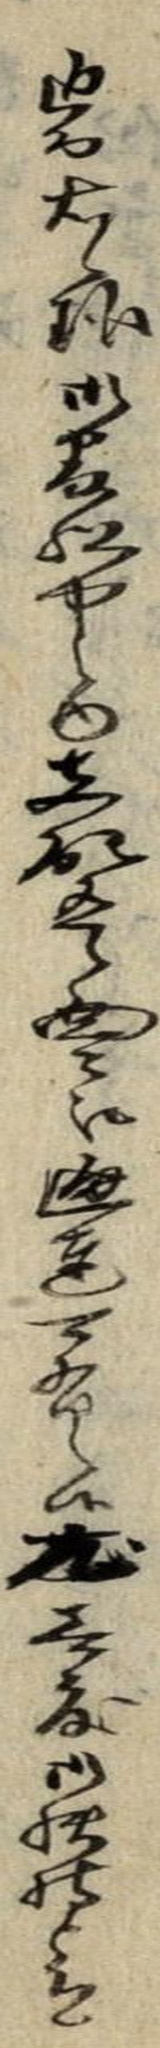追而右之趣御番組中之内支配有之候面々江通達可有之候尤壱度御扶持被下候
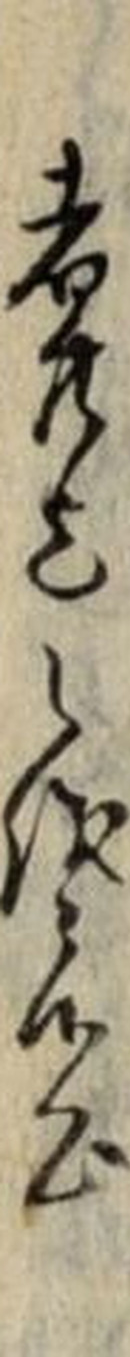者共迄之儀に候以上
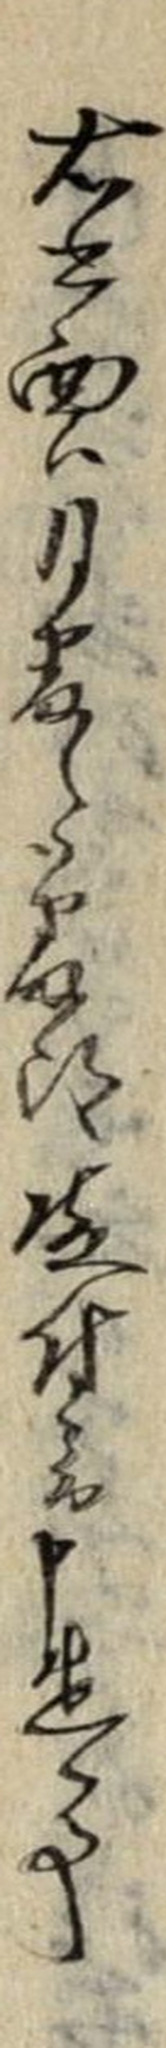右書面は月番之御番頭へ殿付に而申達候事
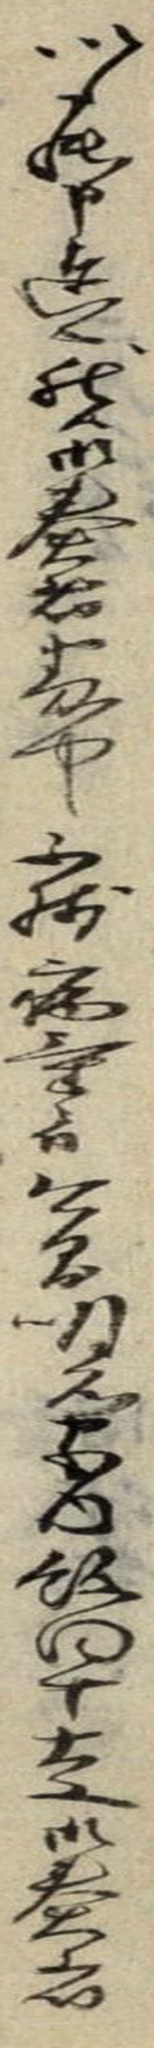以手紙申達候然は御奏者番中不残病気に付今度明石宮内飯田十太夫御奏者
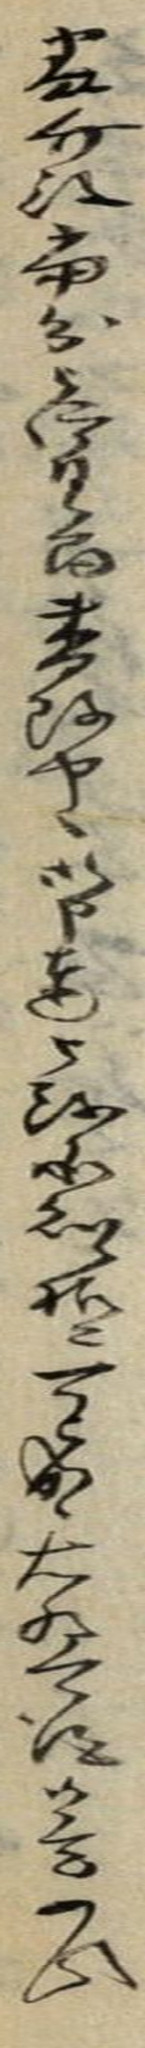番介役当分被仰付候間番役中へ以申達被致承知候様に可被成候右為可得御意如此
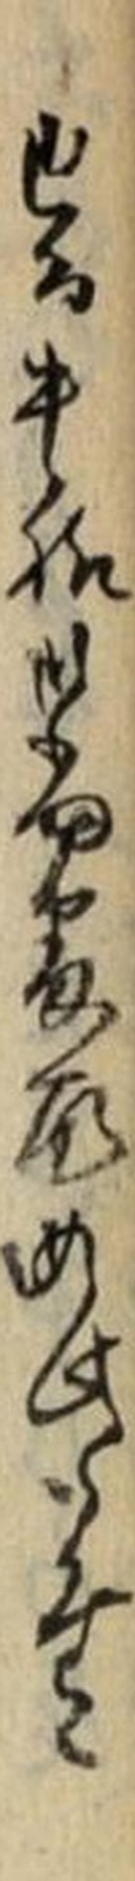追而貴様御当番故如此御座候
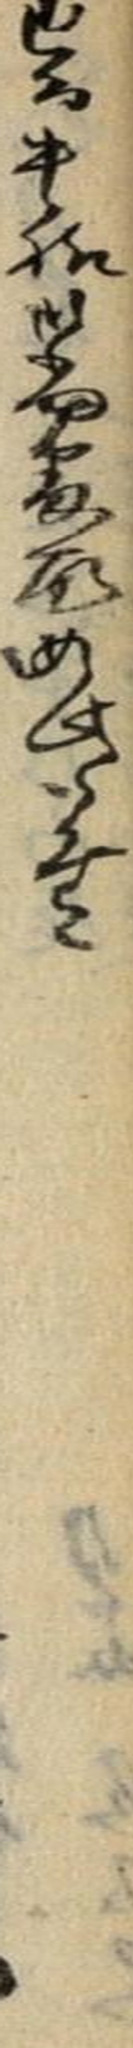追而貴様御当番故如此御座候
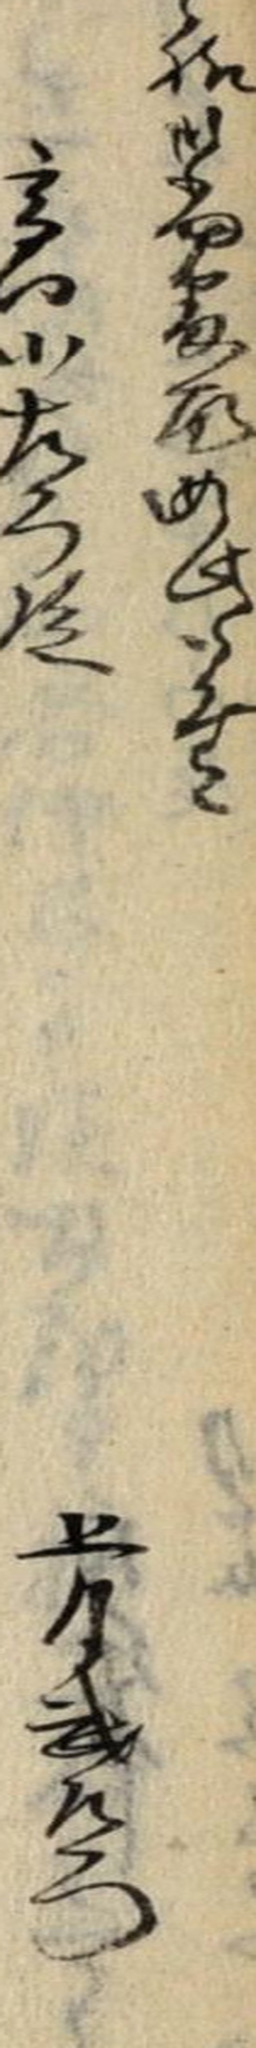高田小左衛門殿上月武左衛門
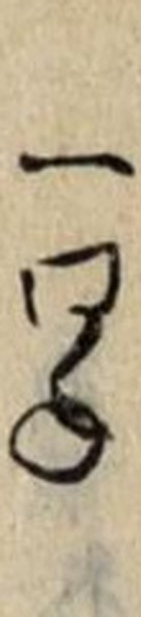一同年
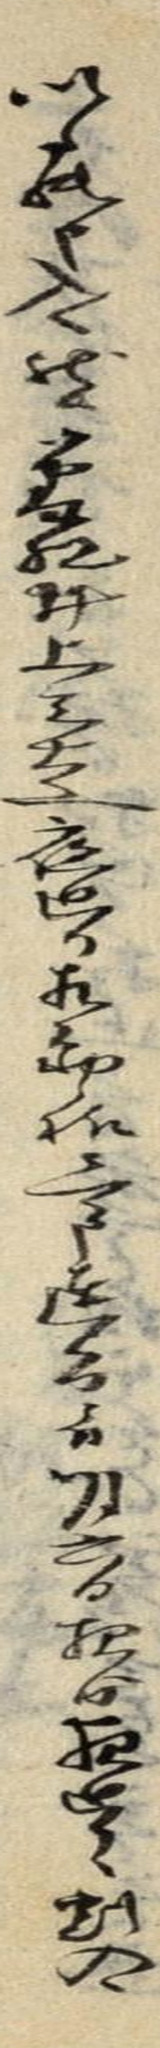以手紙申入候然は御番組井上三太夫夜廻り相勤候様に可申達旨に付明六日夜ゟ夜廻り割入候
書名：蒐輯之部
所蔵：福井県文書館 Fukui Prefectural Archives
